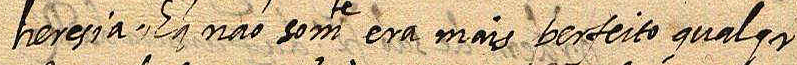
heresia, E q̅ não somte era mais perfeito qualqr̅
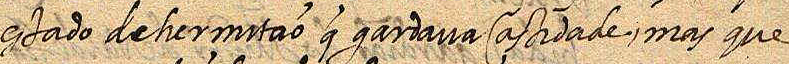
estado de hermitão q̅ gardaua Castidade, mas que
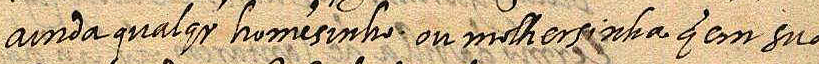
ainda qualqr̅ home̅sinho ou molhersinha q̅ em sua
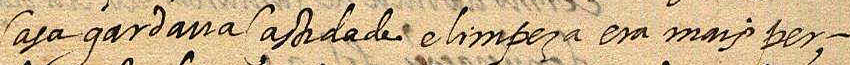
Casa gardaua Castidade e limpeza era mais per
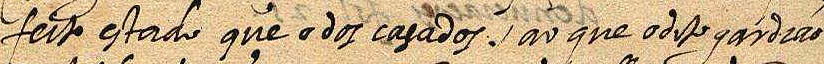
feito estado que o dos casados./ ao que o dito gardião
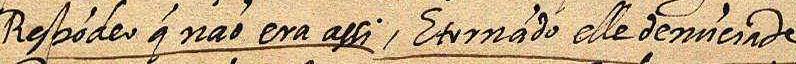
Respo̅deo q̅ não era assi, E torna̅do elle denu̅ciate
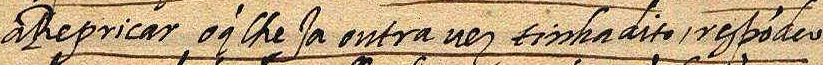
a Repricar o q̅ lhe Ja outra uez tinha dito, respo̅deo
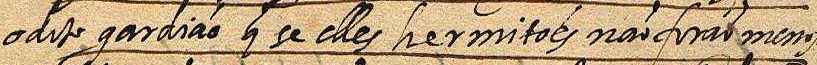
o dito gardião q̅ se elles hermitões não forão menos
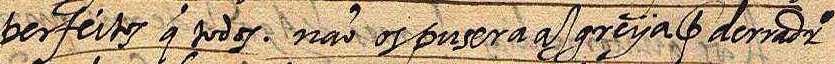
perfeitos q̅ todos. não os pusera a Jgreya p̅ derradro
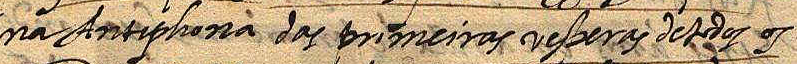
na Antiphona das primeiras vesperas de todos os
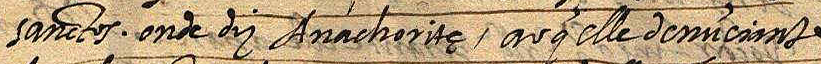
sanctos. onde diz Anachorite, ao q̅ elle denu̅ciante
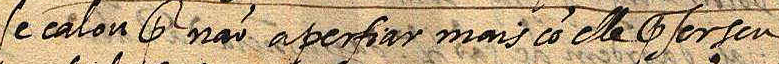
se calou p̅ não aperfiar mais co̅ elle p̅ ser seu
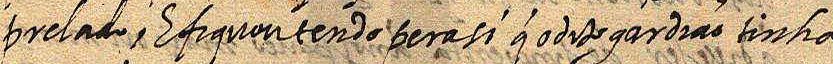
prelado, E fiquou tendo pera si q̅ o dito gardião tinha
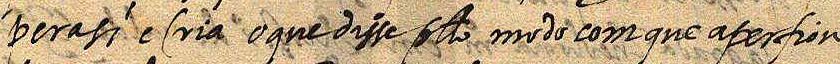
pera si e Cria o que disse p̅llo modo com que aperfiou
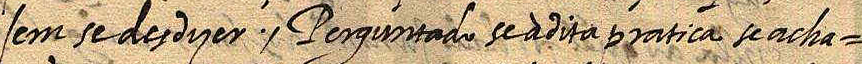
sem se desdizer. Perguntado se à dita pratica se acha
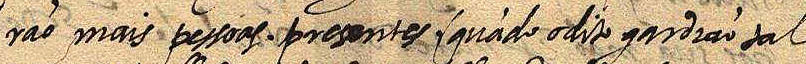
rão mais pessoas. presentes (qua̅do o dito gardião tal
